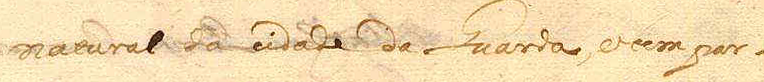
natural da cidade da Guarda, e tem par
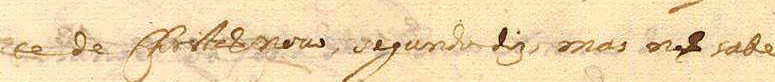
te de Christaõ nouo, segundo diz, mas naõ sabe
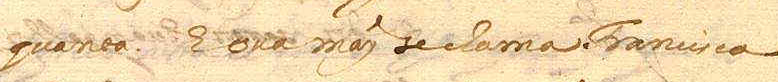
quanta. E sua may se chama Francisca
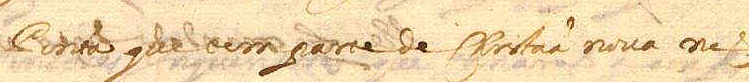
Pinta que tem parte de Christaã noua naõ
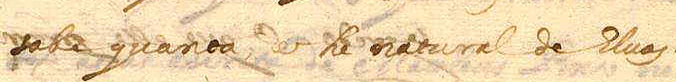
sabe quanto, e he natural de Eluas.
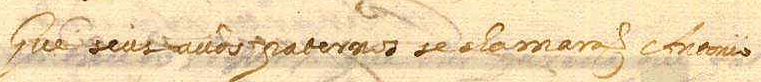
Que seus auos paternos se chamaraõ Antonio
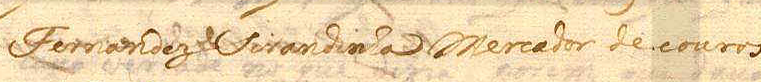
Fernandez Sirandinha Mercador de couros,
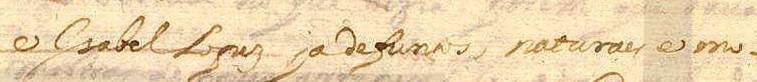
e Jsabel Lopez ja defuntos, naturaes e mo
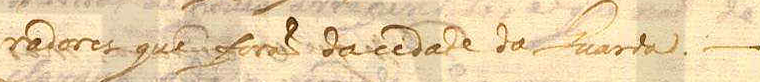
radores que foraõ da cidade da Guarda.
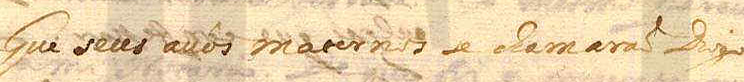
Que seus auos maternos se chamaraõ Diogo
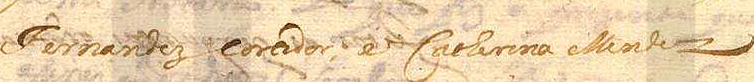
Fernandez cortidor, e Catherina Mendez
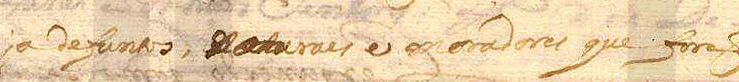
ja defuntos, naturaes e moradores que foraõ
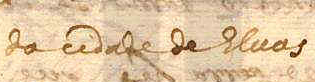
da cidade de Eluas.
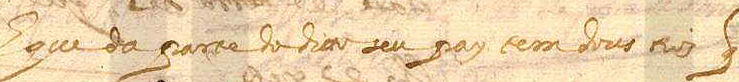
E que da parte do ditto seu pay tem dous tios q̄
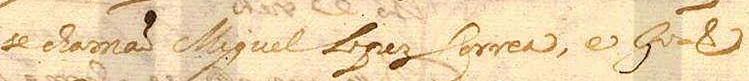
se chamaõ Miguel Lopez Correa, e Joaõ
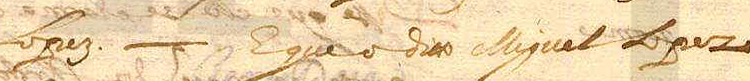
Lopez. ‒ E que o ditto Miguel Lopez
